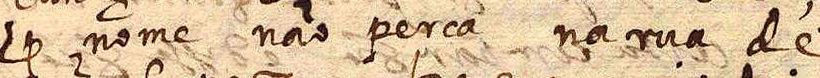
p̄ nome não perca na rua de
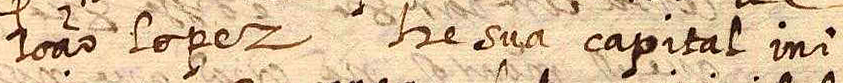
Ioão Lopez he sua capital ini
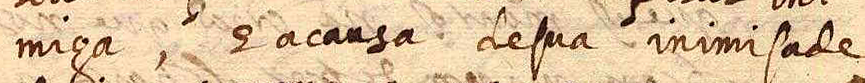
miga, E a causa de sua inimisade
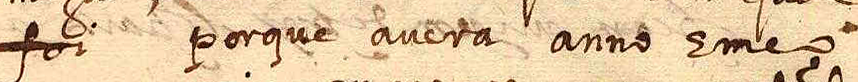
foi porque auera anno E meo
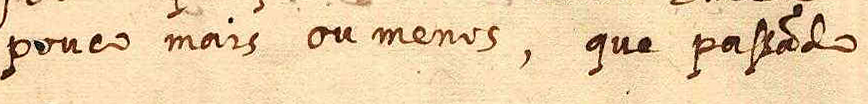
pouco mais ou menos, que passādo
